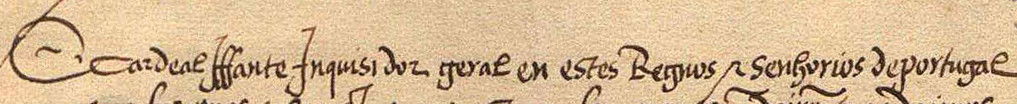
O Cardeal Jffante Jnquisidor geral en estes Regnos e senhorios de portugal
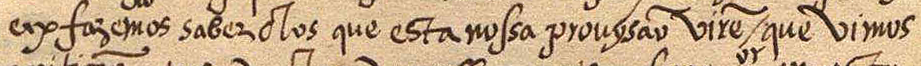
ecꝭ fazemos saber Aos que esta nossa prouysão virē / que vimos
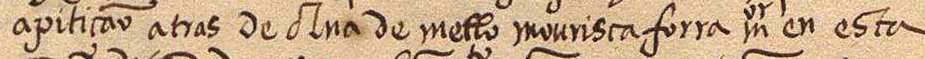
a pitição atras de Ana de mello mourisca forra mor en esta
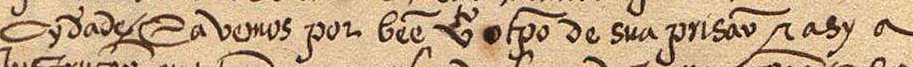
Cydade / e avemos por bēe vto o tp̄o de sua prisão e asy a
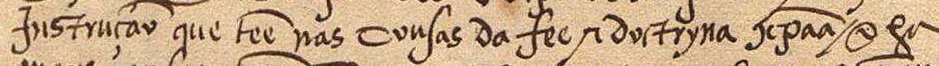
Jnstrução que tēe nas Cousas da fee e doctryna xp̄aa / e ha
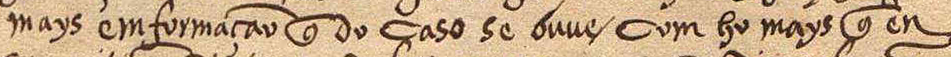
mays emformação q̄ do Caso se ouue / Com ho mays q̄ en
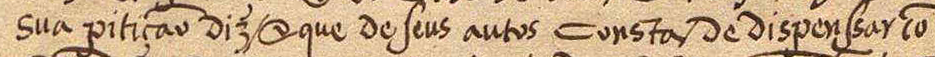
sua pitição diz / e que de seus autos Consta / de dispenssar c̄o
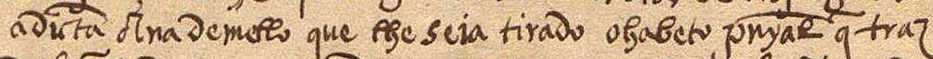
a dicta Ana de mello que lhe seia tirado o habeto pn̄yal q̄ traz
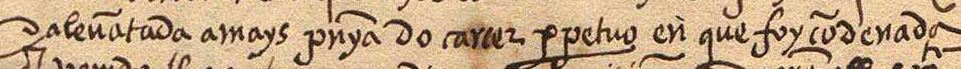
e aleuātada a mays pnȳa do carcer ꝑpetuo en que foy c̄odenada
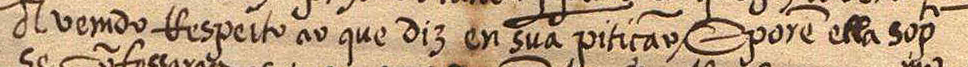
Avemdo Respeito ao que diz en sua pitição / E porē ella sopte
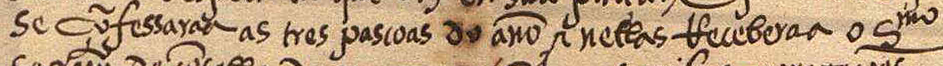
se Cōfessara as tres pascoas do āno e nellas Receberaa o Smo
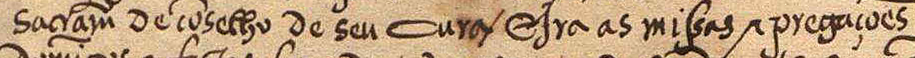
sacramto de c̄oselho de seu Cura / E Jra as missas e pregações
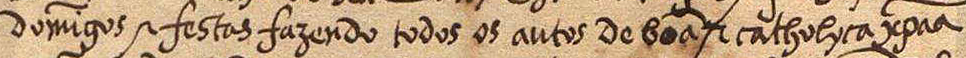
domigos e festas fazendo todos os autos de bōa e catholyca xp̄aa
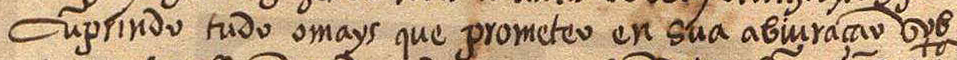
Cūprindo tudo o mays que prometeo en sua abiuração sob
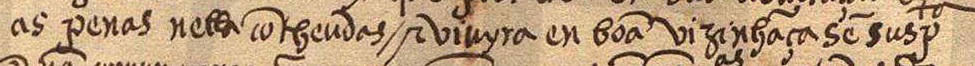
as penas nella c̄otheudas / e viuyra en bōa vizinhāça sē suspta
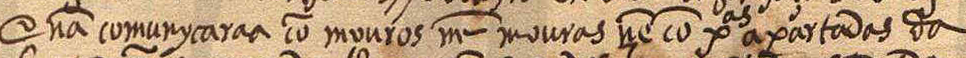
e n̄a comunycaraa c̄o mouros n̄e mouras n̄e c̄o pas apartadas da
